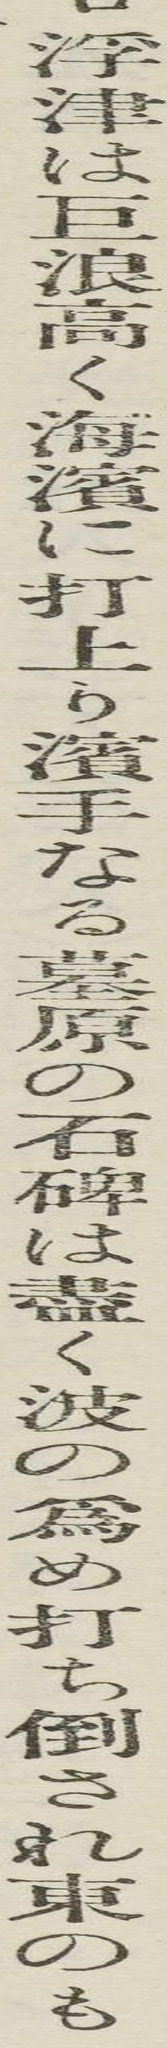浮津は巨浪高く海浜に打上り浜手なる墓原の石碑は尽く波の為め打ち倒され東のも
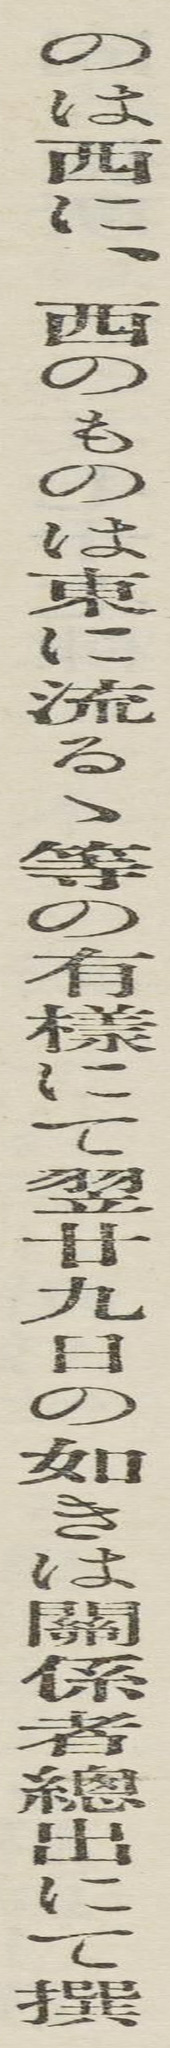のは西に、西のものは東に流るゝ等の有様にて翌廿九日の如きは関係者総出にて撰
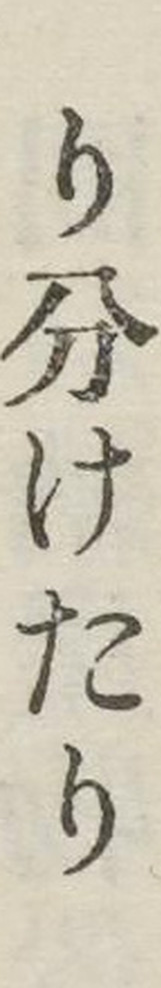り分けたり
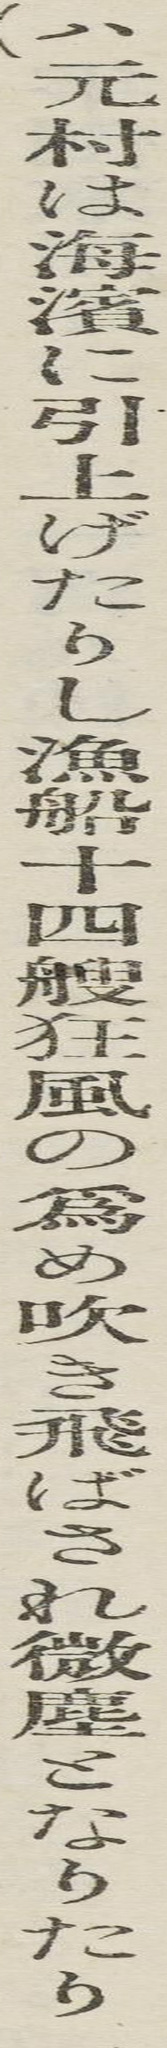元村は海浜に引上げたりし漁船十四艘狂風の為め吹き飛ばされ微塵となりたり
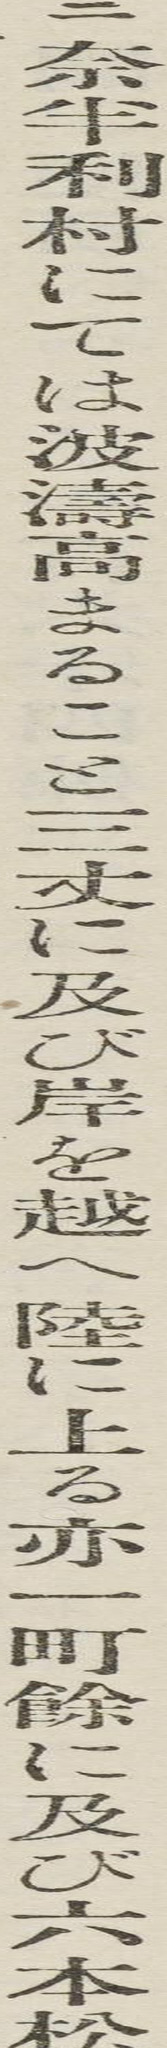奈半利村にては波濤高まること三丈に及び岸を越へ陸に上る亦一町余に及び六本松
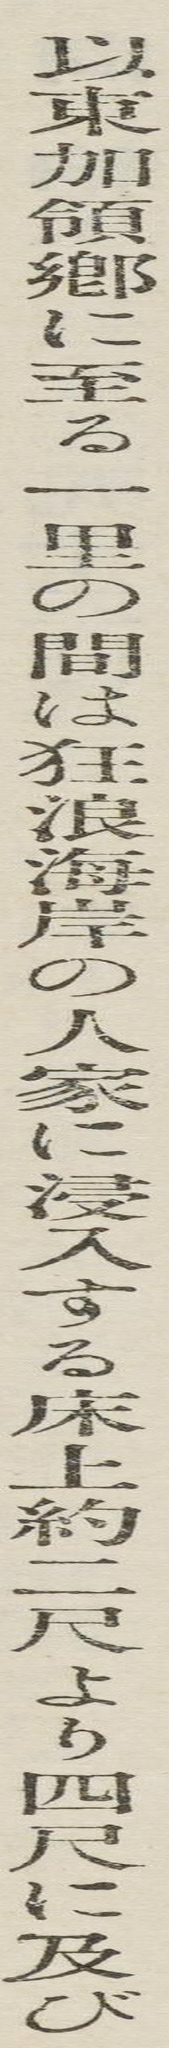以東加領郷に至る一里の間は狂浪海岸の人家に侵入する床上約二尺より四尺に及び
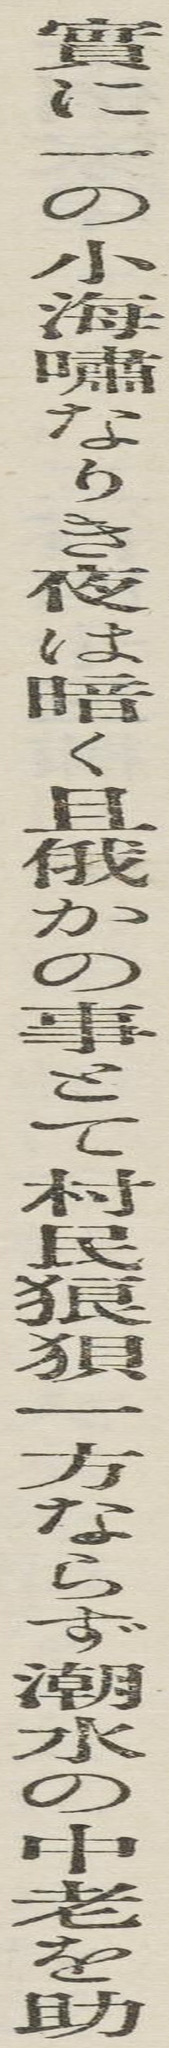実に一の小海嘯なりき夜は暗く且俄かの事とて村民狼狽一方ならず潮水の中老を助
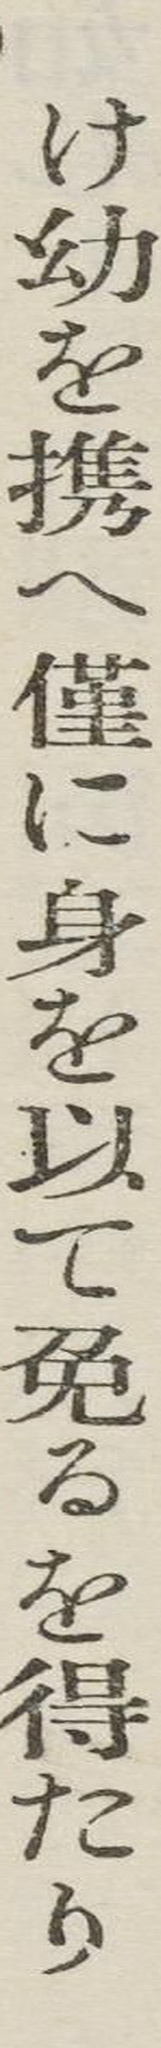け幼を携へ僅に身を以て免るを得たり
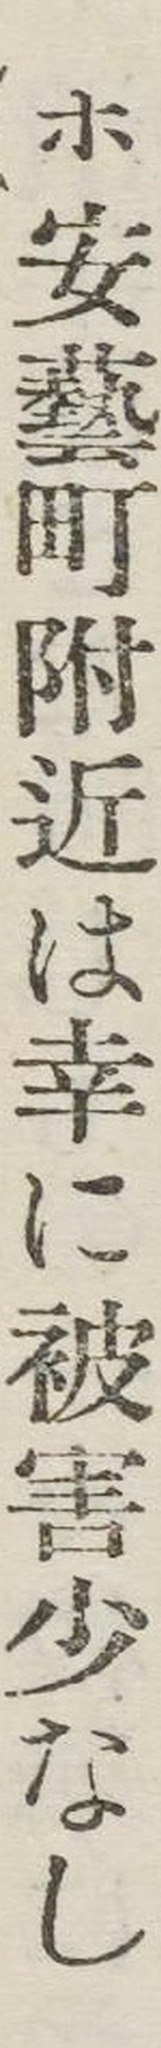安芸町附近は幸に被害少なし
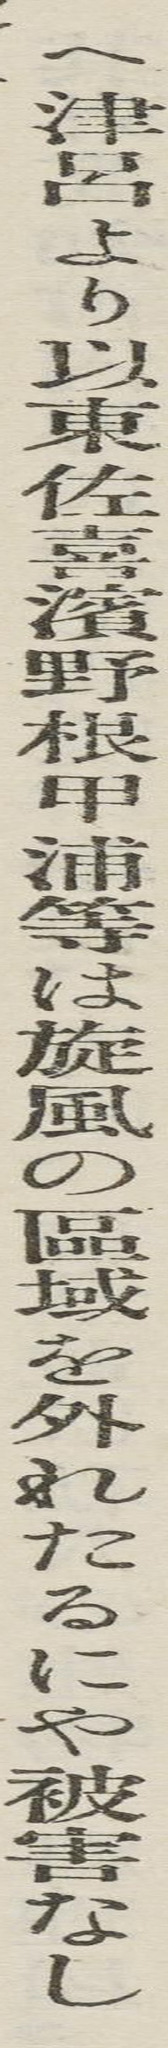津呂より以東佐喜浜野根甲浦等は旋風の区域を外れたるにや被害なし
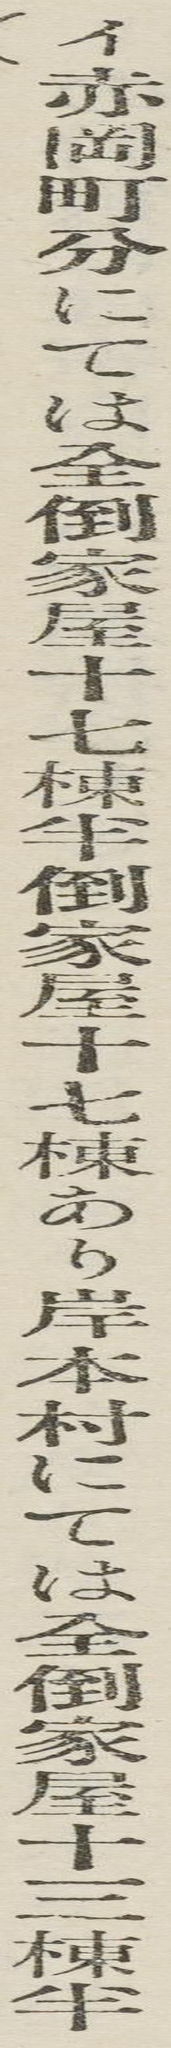赤岡町分にては全倒家屋十七棟半倒家屋十七棟あり岸本村にては全倒家屋十三棟半
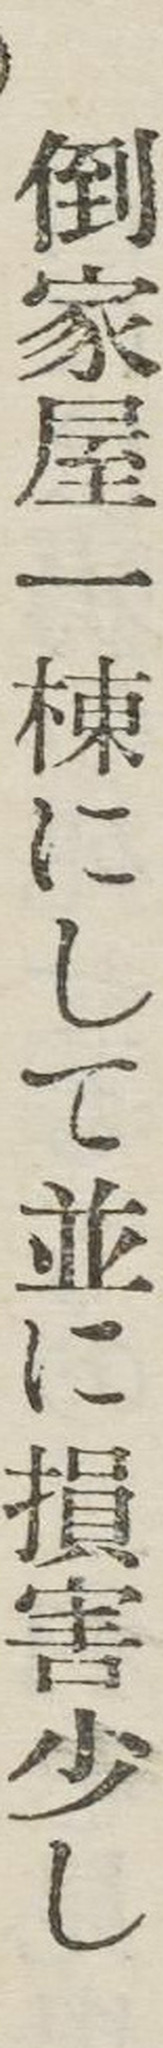倒家屋一棟にして並に損害少し
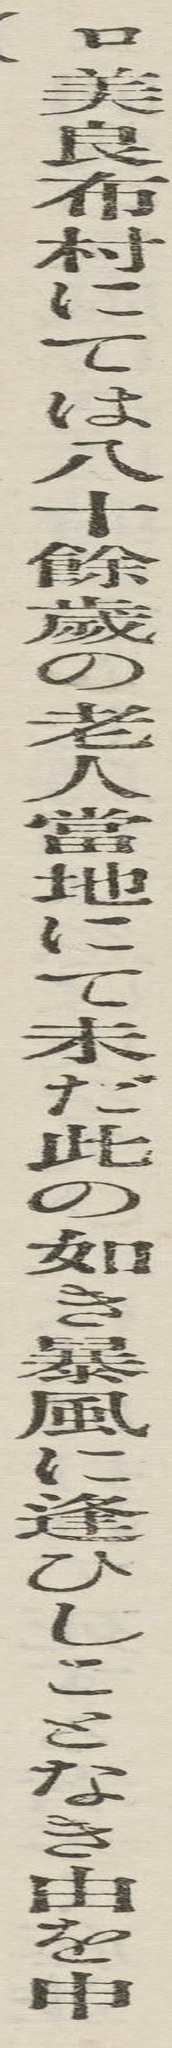美良布村にては八十余歳の老人当地にて未だ此の如き暴風に逢ひしことなき由を申
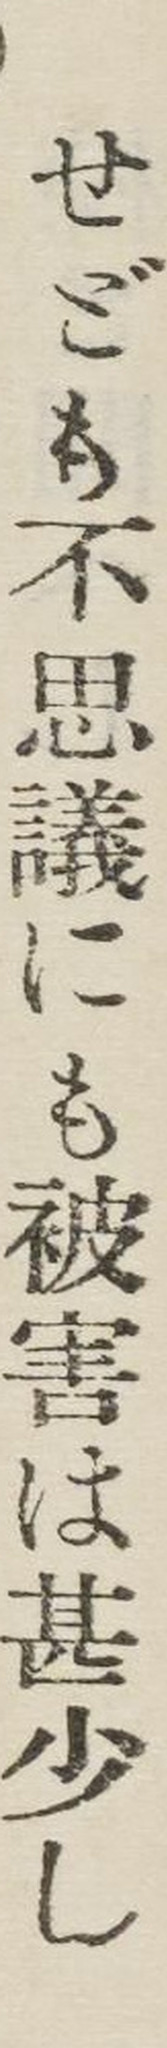せども不思議にも被害は甚少し
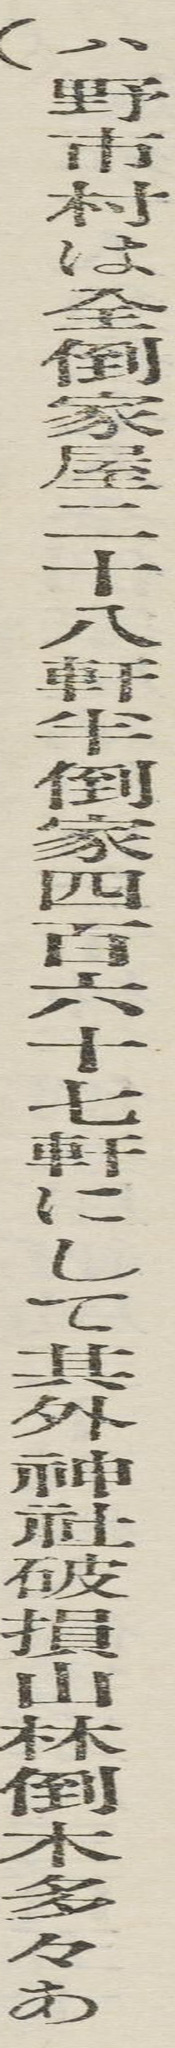野市村は全倒家屋二十八軒半倒家四百六十七軒にして其外神社破損山林倒木多々あ
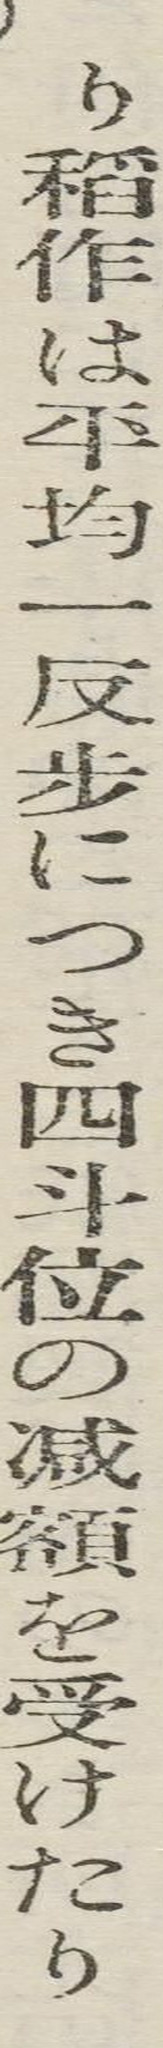り稲作は平均一反歩につき四斗位の減額を受けたり
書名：土佐古今ノ地震
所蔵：東京大学地震研究所図書室 Earthquake Research Institute Library, The University of Tokyo, JAPAN
